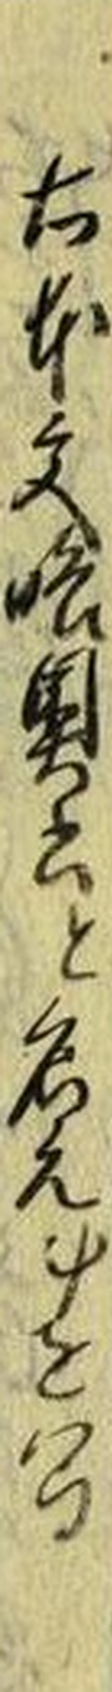右本文略奥書と名元計を写
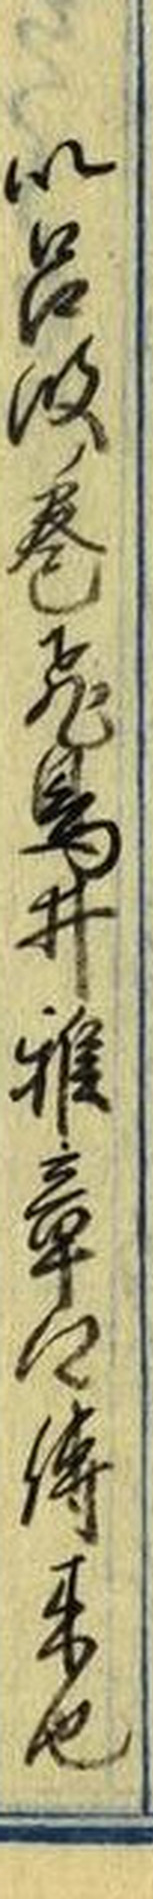いろはの巻飛鳥井雅章卿伝来也
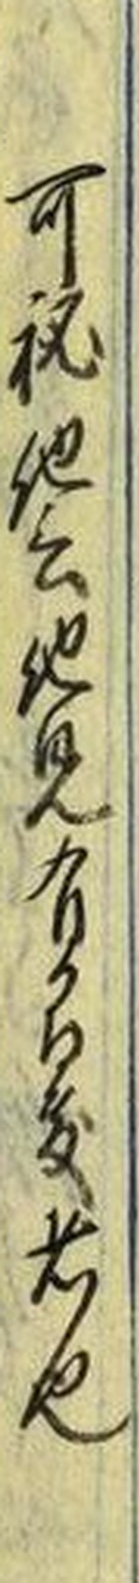可秘他言他見有間敷者也
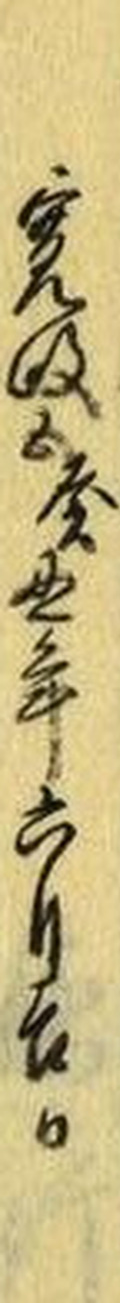寛政五癸丑年六月吉日
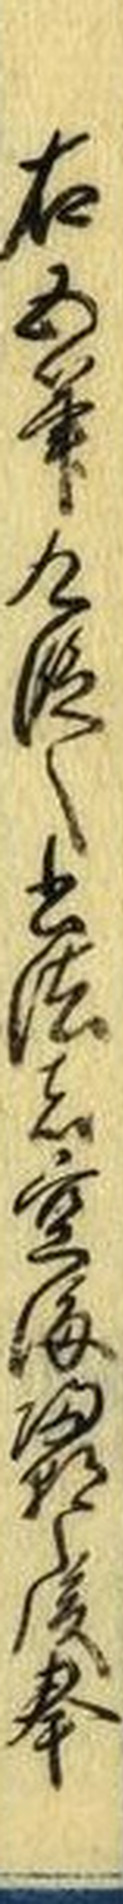右五筆九段之書法は空海帰朝之後奉
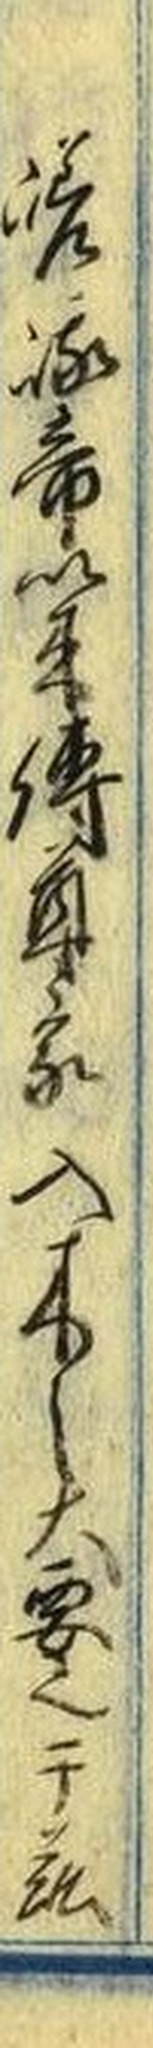嵯峨帝以来伝尊家入木之大要也于茲
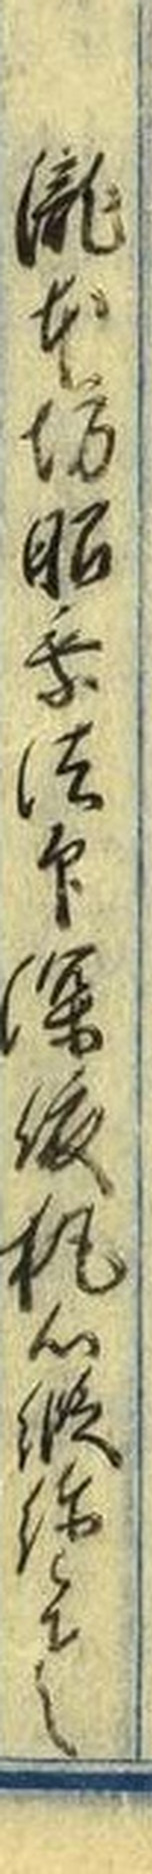瀧本坊昭乗法印深依執心鍛錬被下之
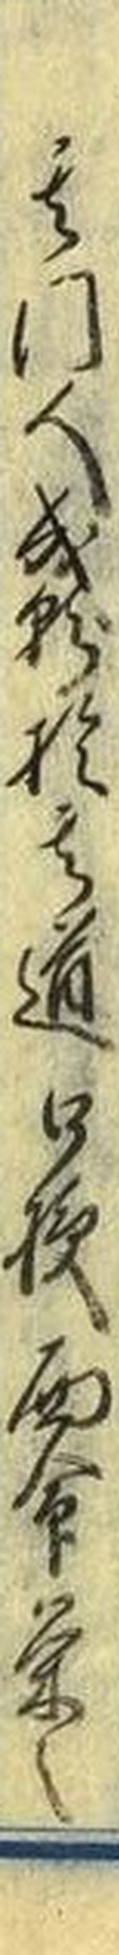其門人成就於其道口授面命栄之
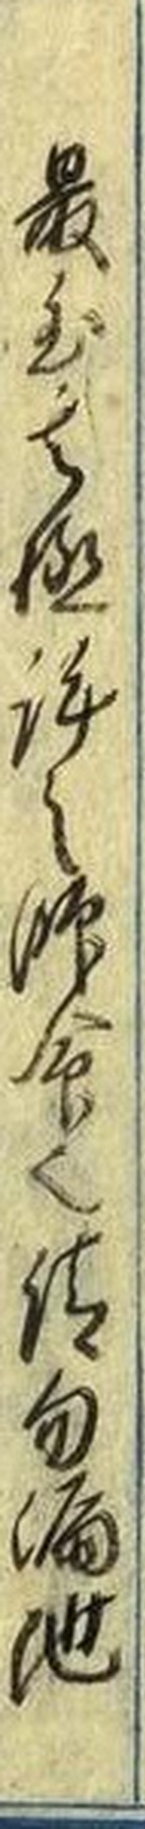最至其極許之師命也請勿漏泄
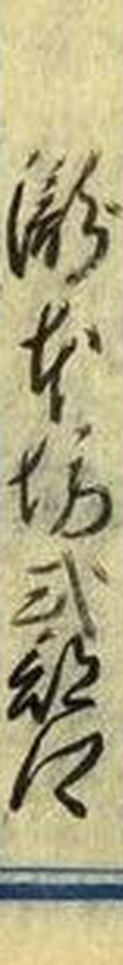瀧本坊式部卿
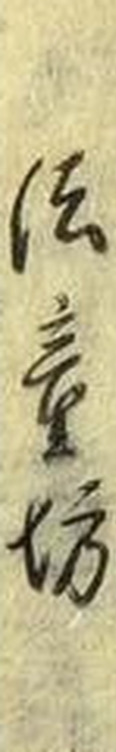法童坊

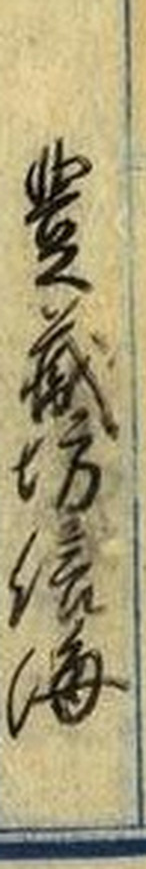豊蔵坊信海
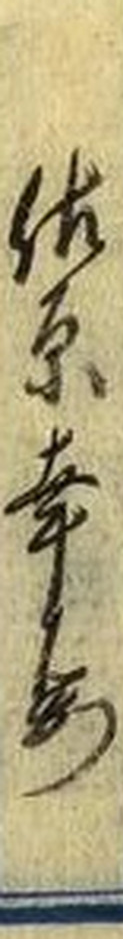佐原幸右衛門
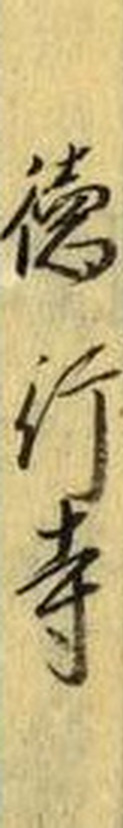徳行寺
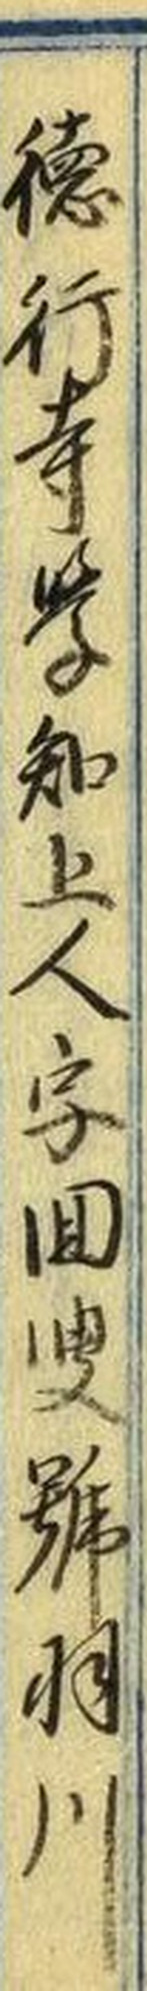徳行寺學知上人字囬叟號羽川
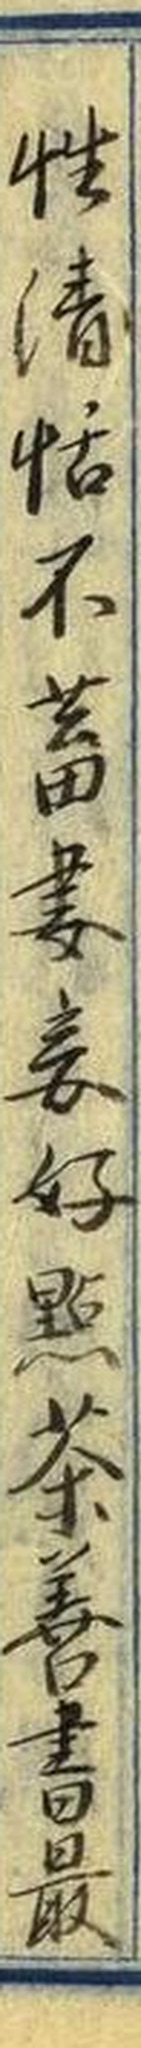性清恬不蓄妻妾好點茶善書最
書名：温古集 四巻
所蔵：福井県文書館 Fukui Prefectural Archives
